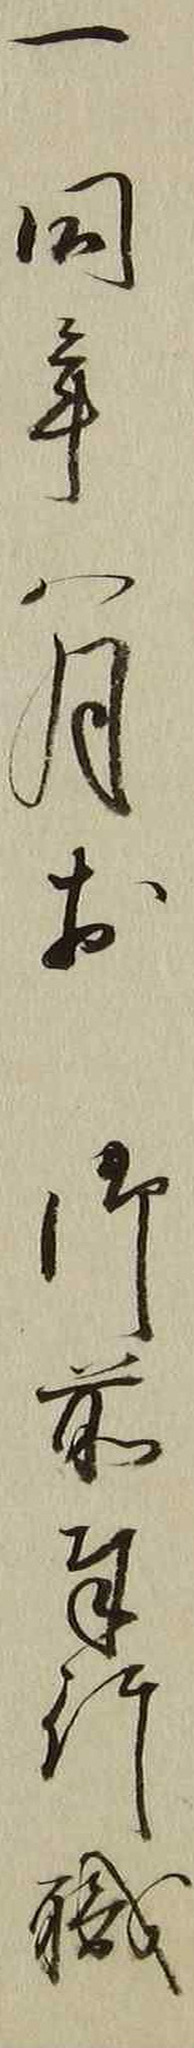一同年八月於御前奉行職
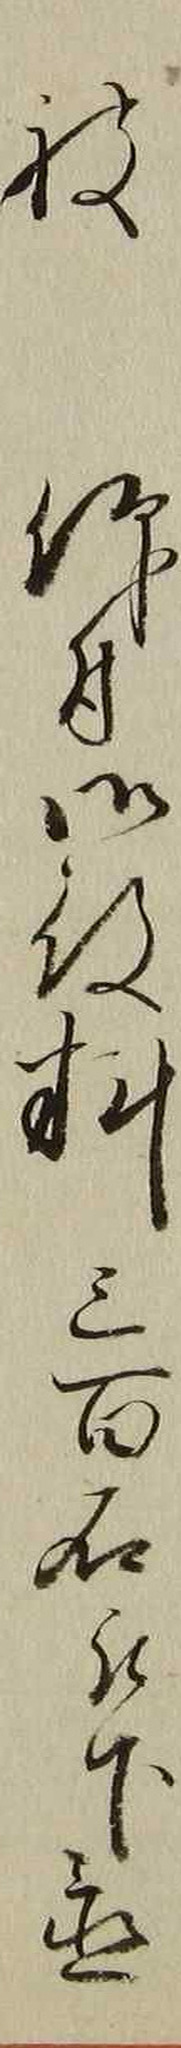被仰付御役料三百石被下置
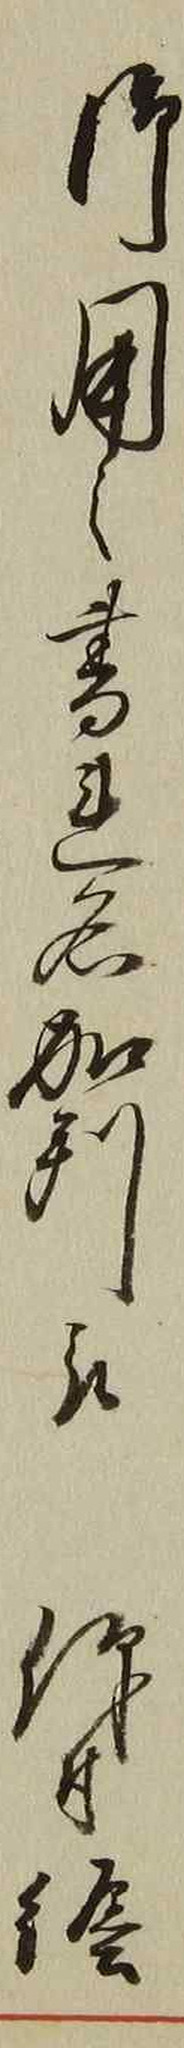御用之書連名加判被仰付纏
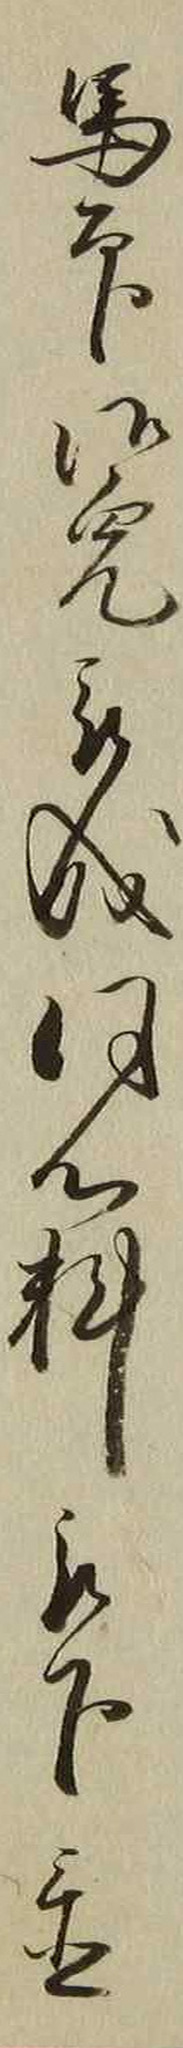馬印御免被成同心料被下置
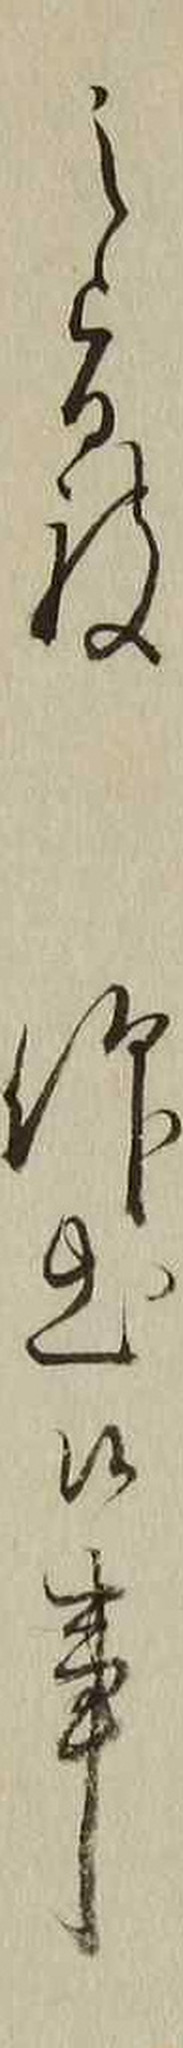之旨被仰出候事
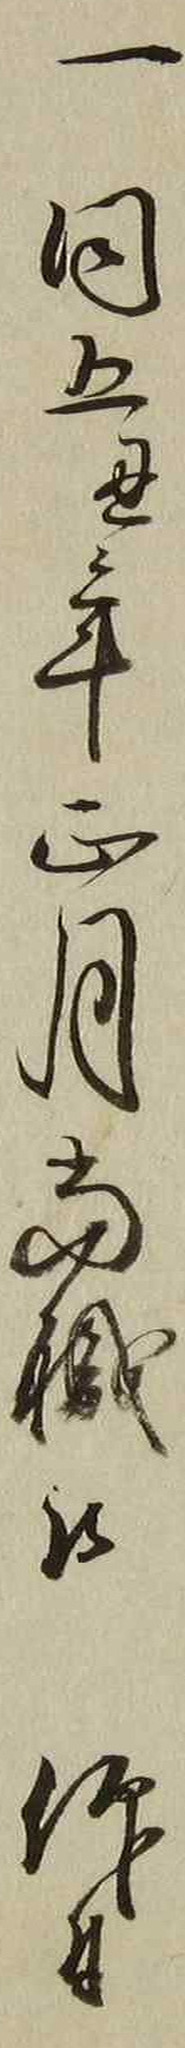一同五丑年正月当職被仰付
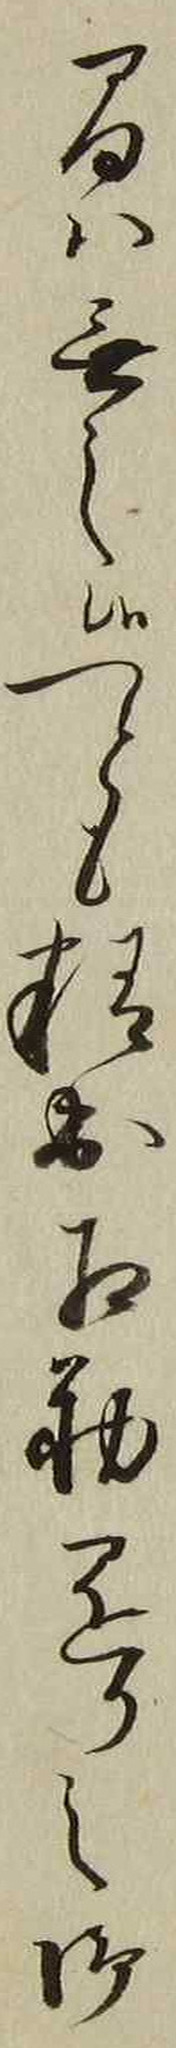間ハ無之候へとも精出相勤懸り之御
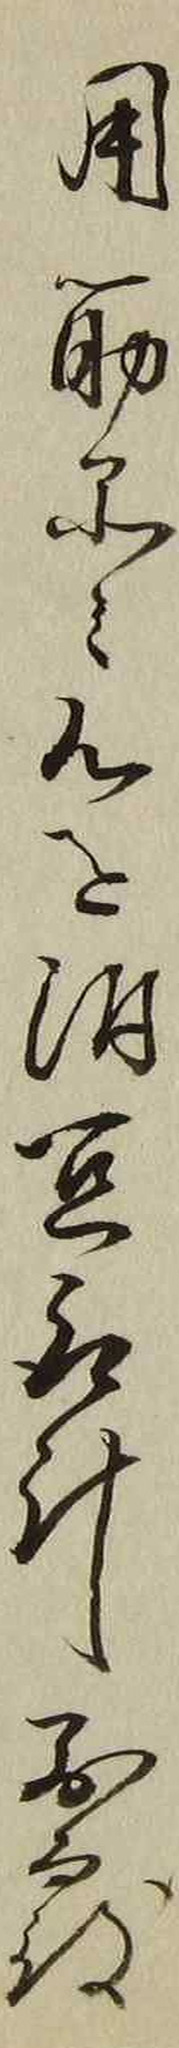用筋品々心を附宜取計別而致
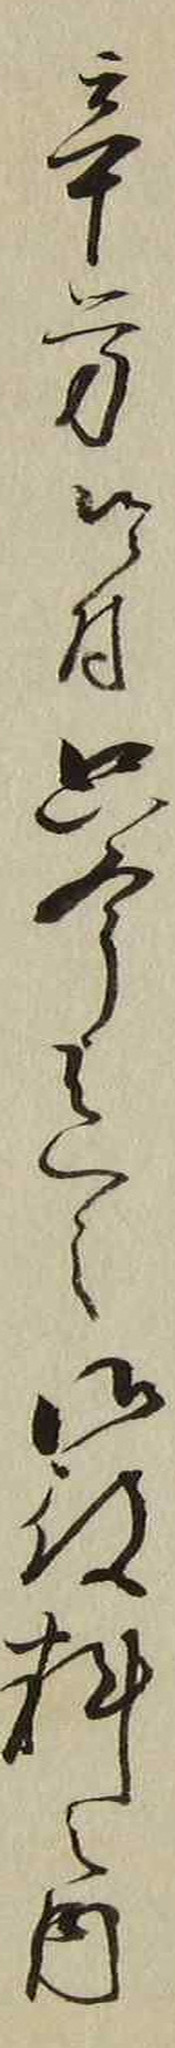辛労候ニ付只今迄之御役料之内
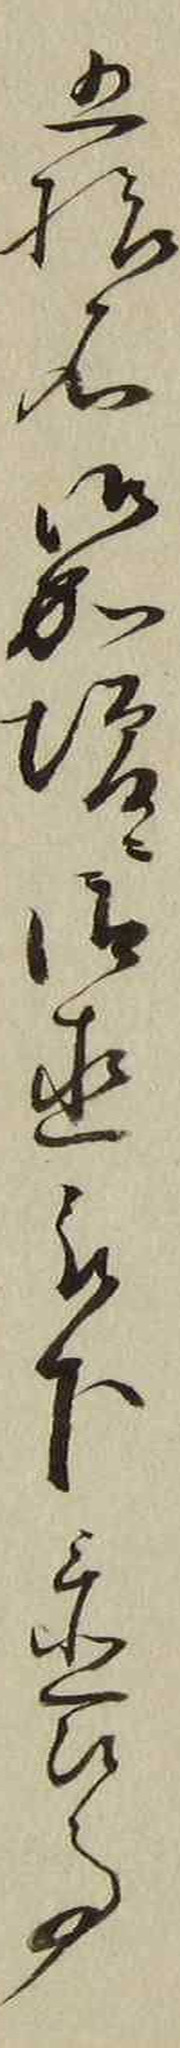五拾石御加増ニ御直被下置候事
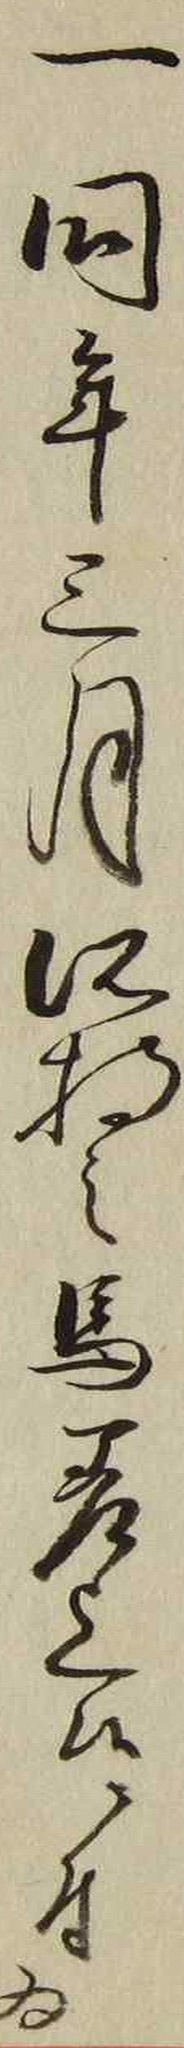一同年三月所持之馬差上候ニ付為
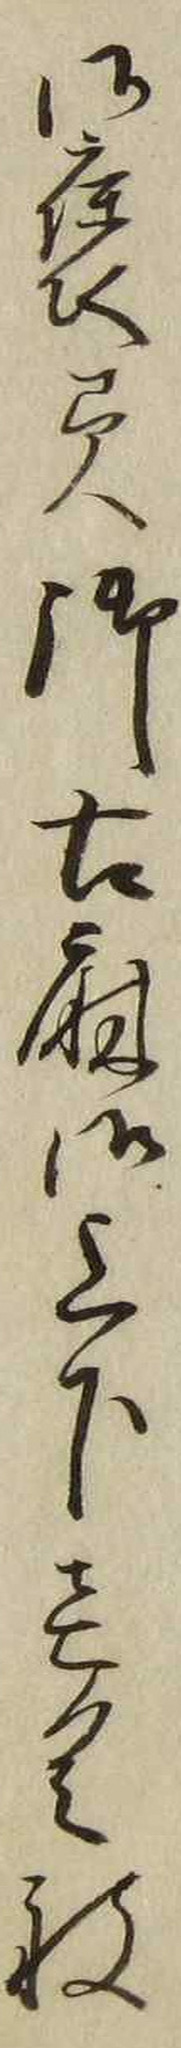御褒美御古麻御上下壱具被

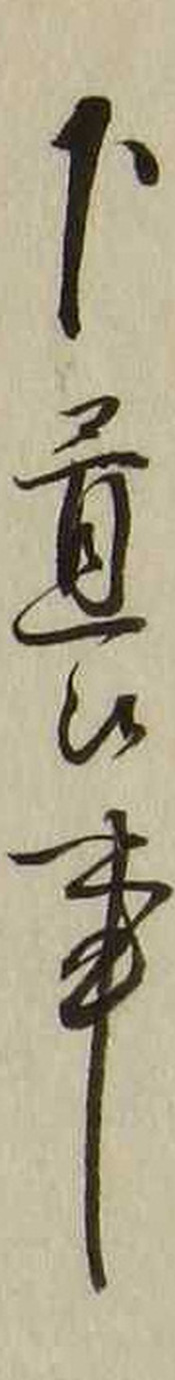下置候事
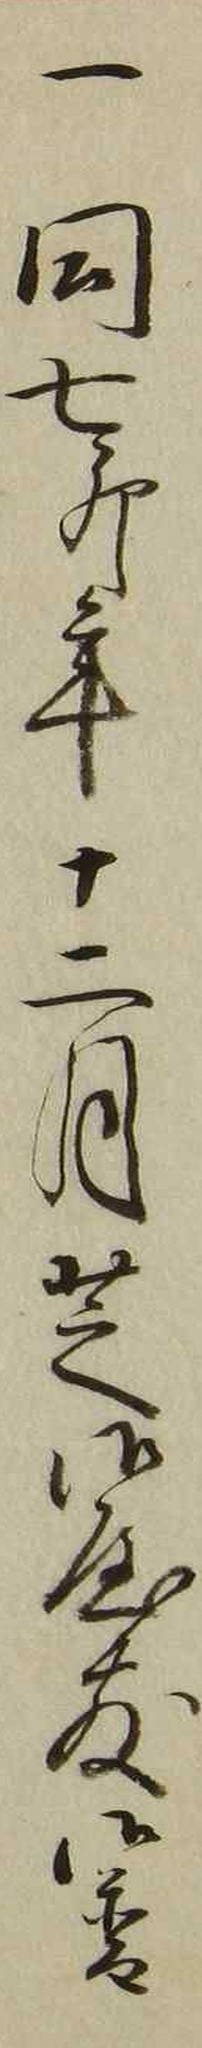一同七卯年十二月芝御屋敷御普
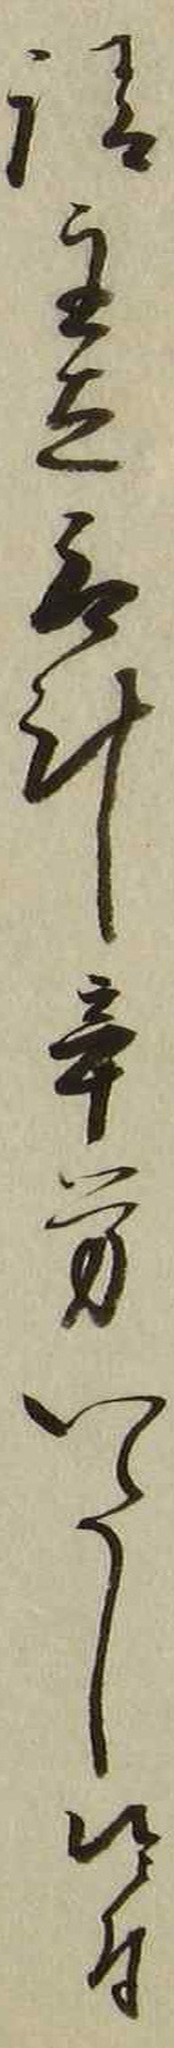請取計辛労いたし候ニ付
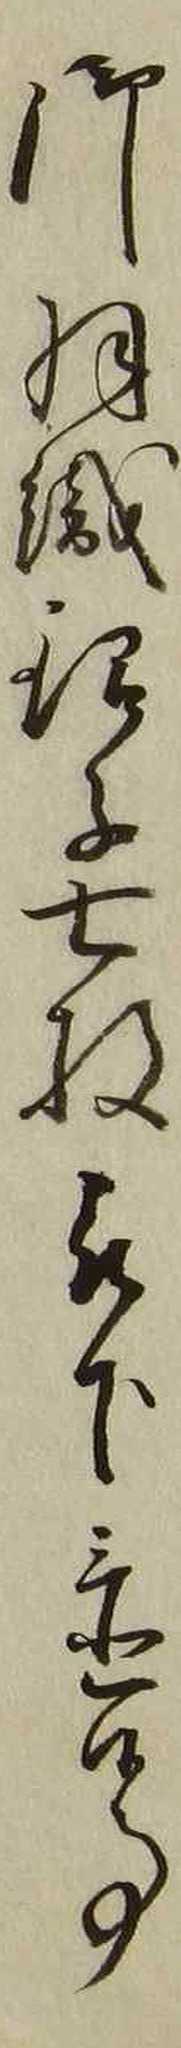御羽織銀子七枚被下置候事
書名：諸士系譜　巻之2　い之部2
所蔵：会津若松市立会津図書館
